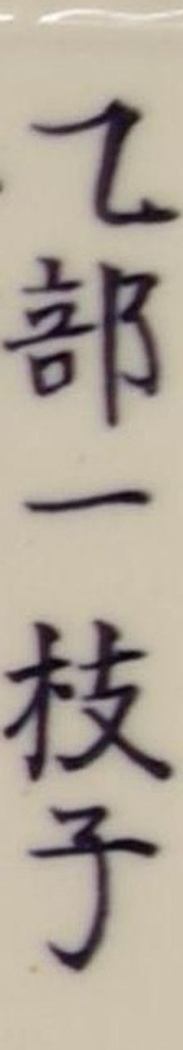乙部一枝子
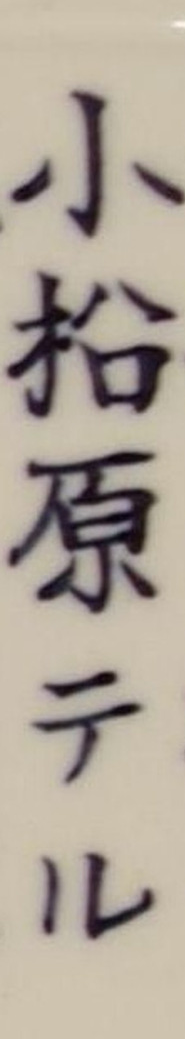小松原テル
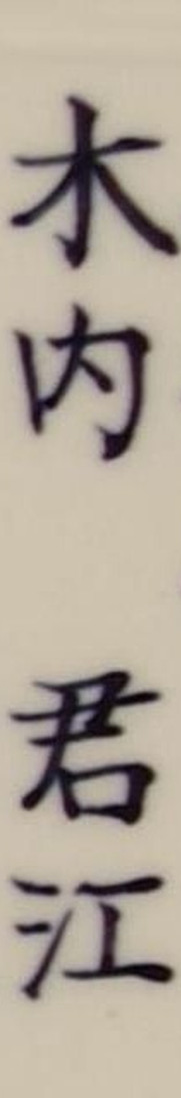木内君江
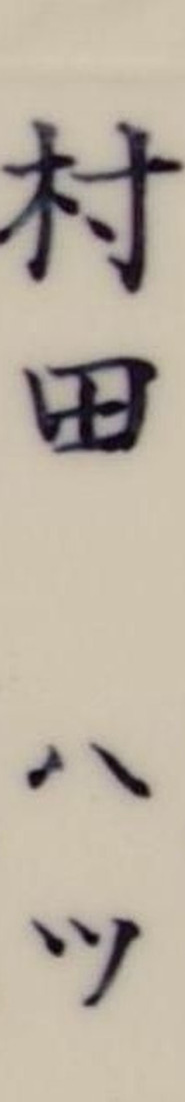村田ハツ
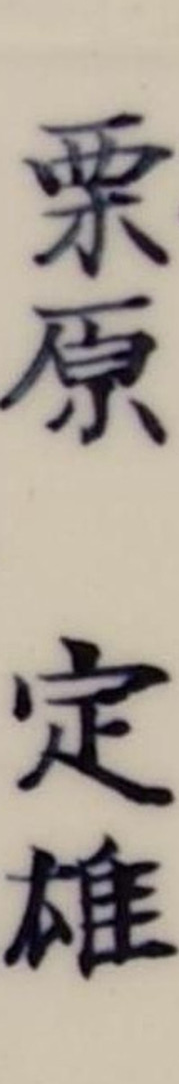栗原定雄
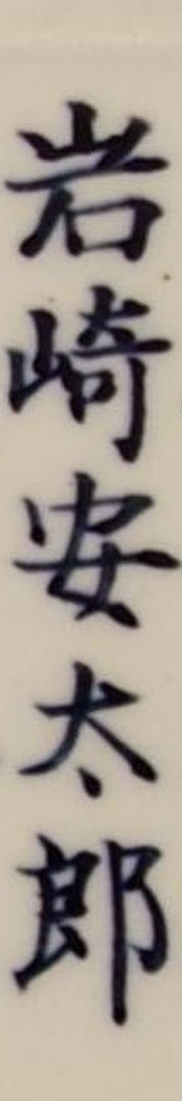岩崎安太郎
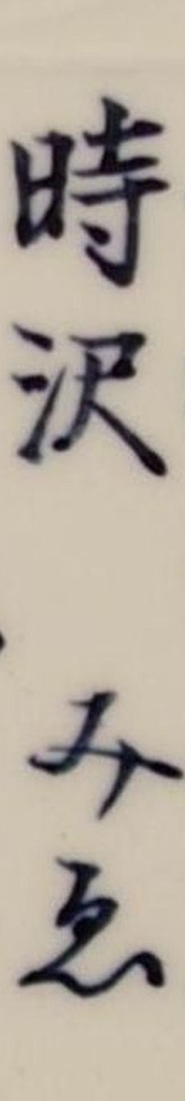時沢みゑ
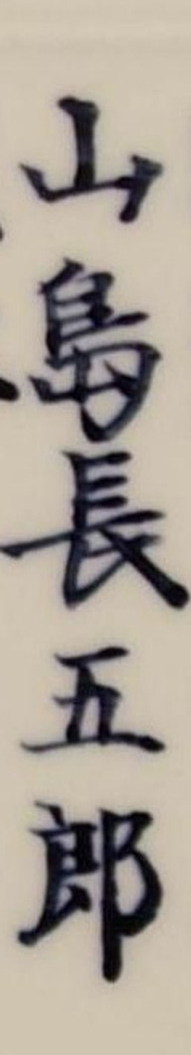山島長五郎
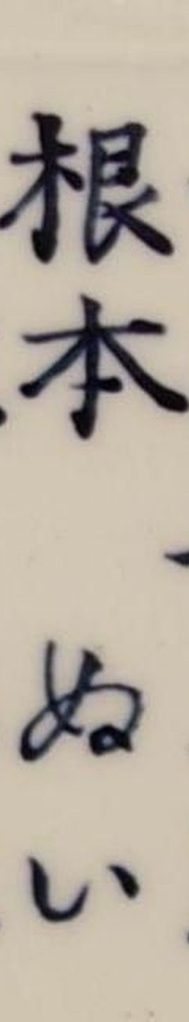根本ぬい
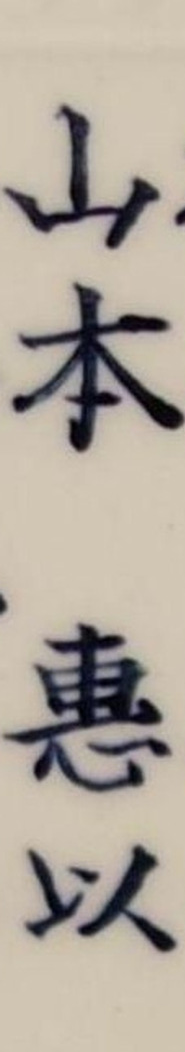山本恵以
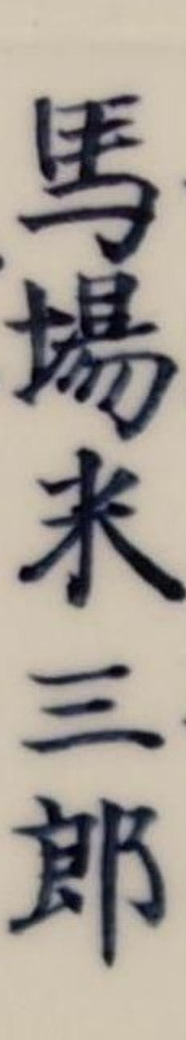馬場米三郎
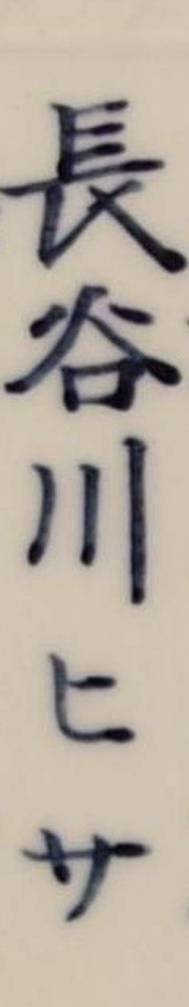長谷川ヒサ
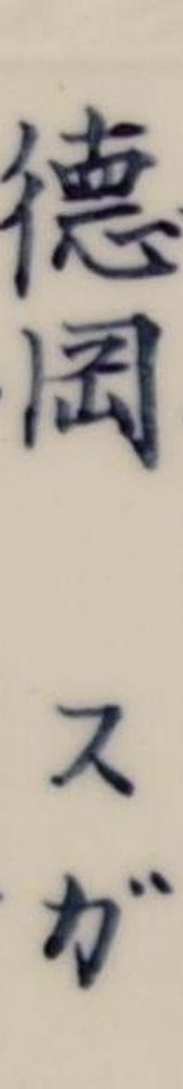徳岡スガ
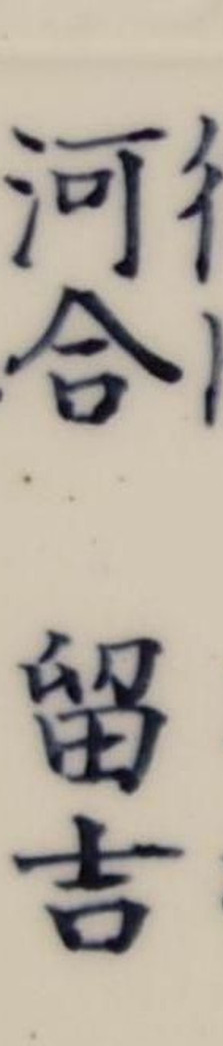河合留吉
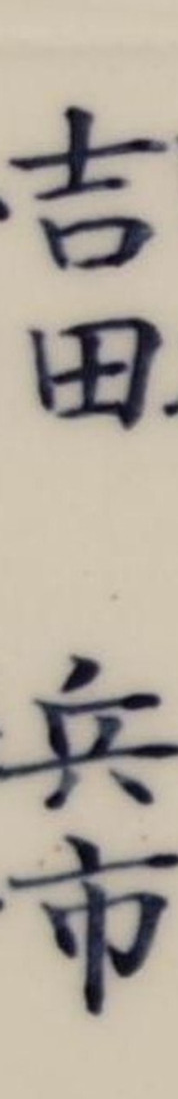吉田兵市
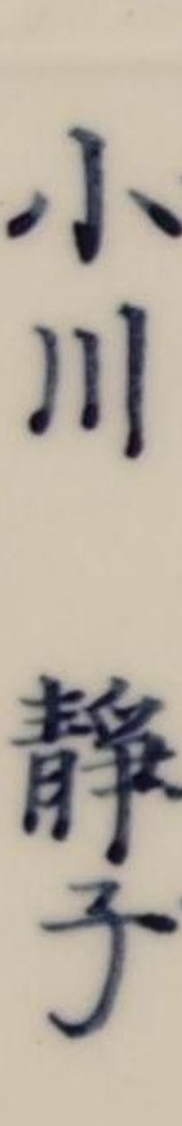小川静子
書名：M~S
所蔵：高野山金剛峯寺
